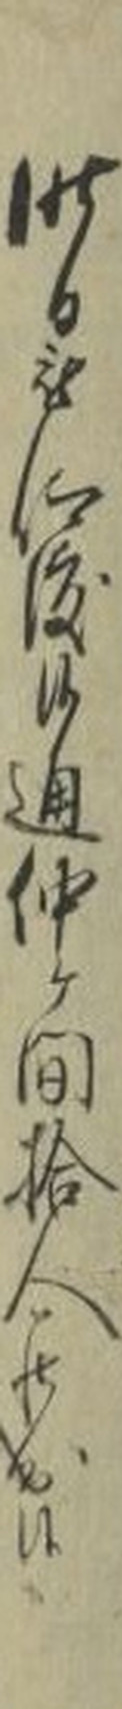昨日被仰渡候通仲か間拾人罷出候
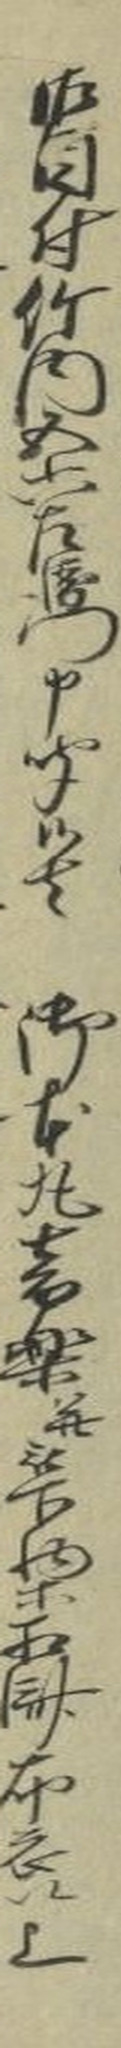一御目付竹内五六左衛門申聞候は御本丸音楽并被下物等相済布衣以上
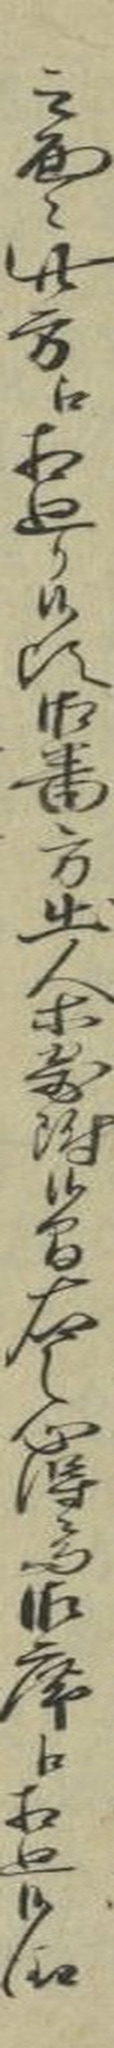之面々此方え相廻り候頃御番方出入等寄附候間右之心得にて御席え相廻候様
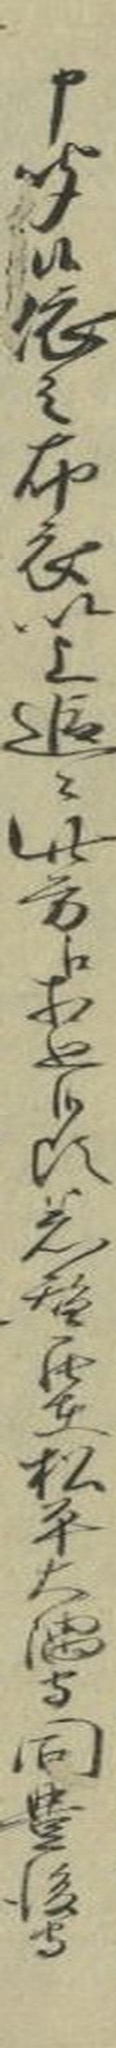申聞候依之布衣以上追々此方え相廻り候頃着替罷在松平大隅守同豊後守
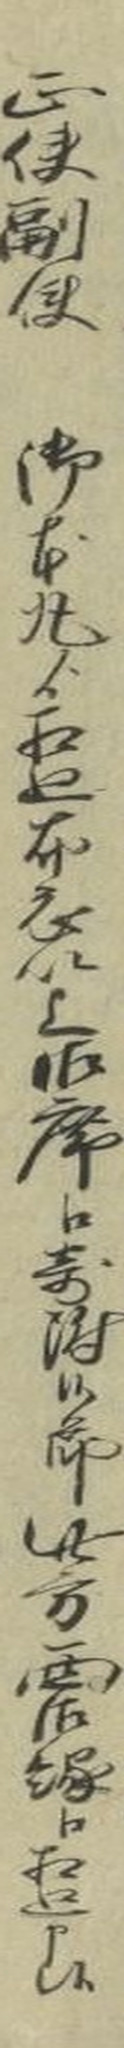正使副使御本丸ゟ相廻布衣以上御席え寄附候節此方西御縁え相廻申候
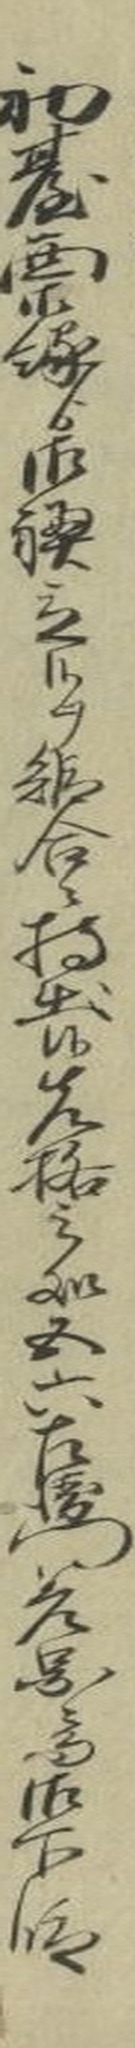一初台西御縁ゟ御襖立候を緞合に持出候先格之処五六左衛門差図にて御下段
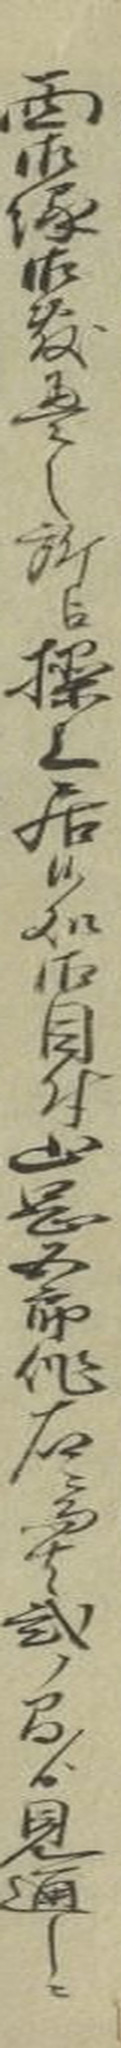西御縁御敷畳之所え操上居候処御目付山岡五郎作右にては弐の間ゟ見通しに
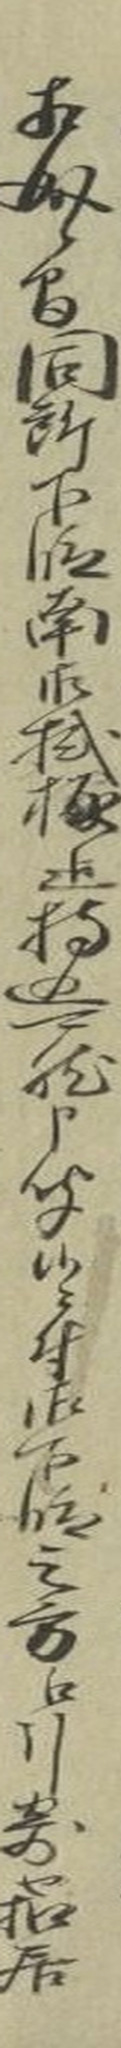相成候間同所下段南御拭縁迄持込可然申聞候に付御下段之方え引寄せ扣居
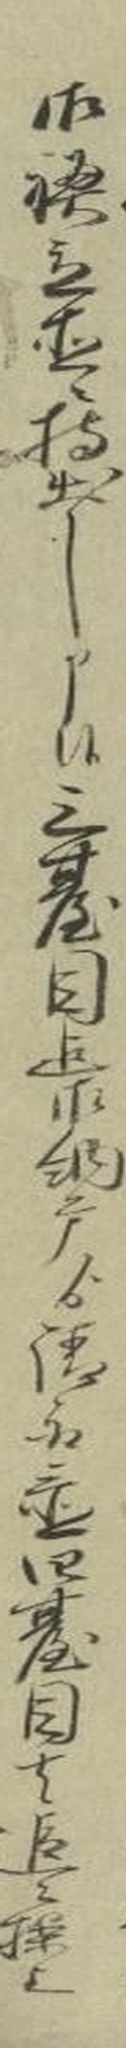御襖立直に持出し申候三台目迄御納戸ゟ請取置四台目は追々操上
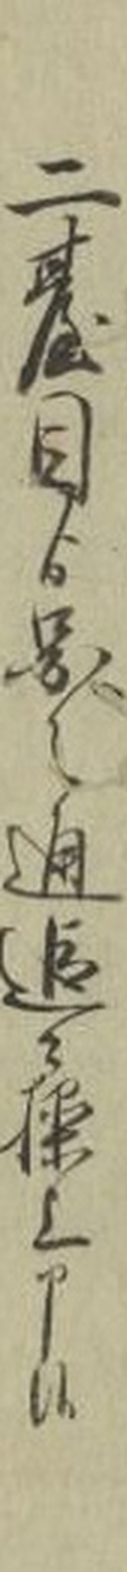一二台目ゟ図之通追々操上申候
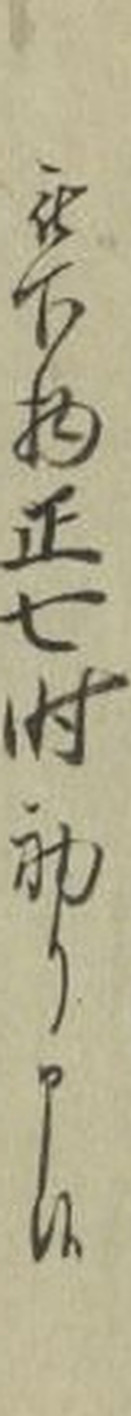一被下物正七時初り申候
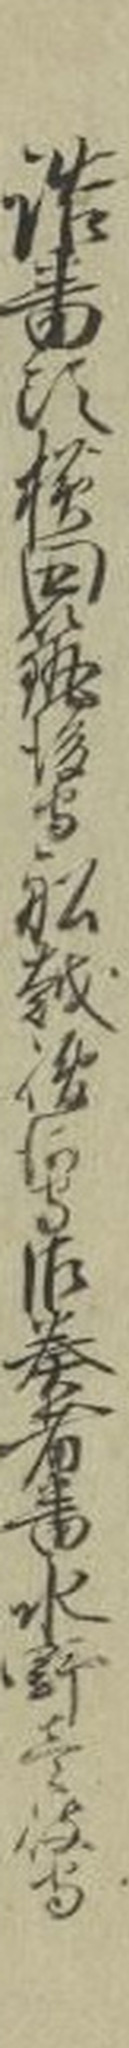一詰番頭横田筑後守船越駿河守御奏者番水野壱岐守
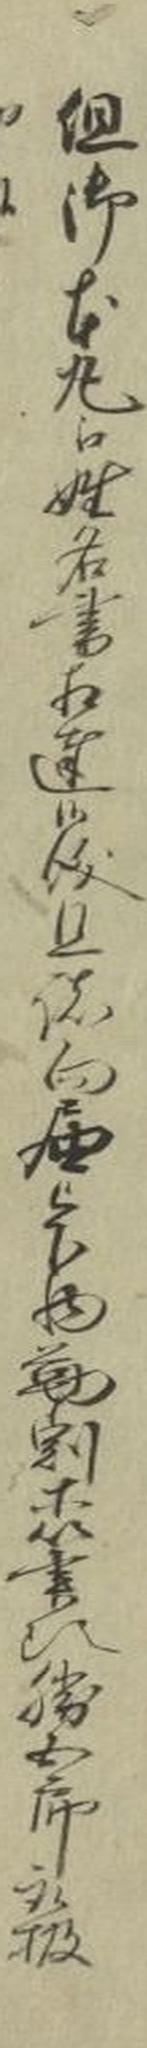但御本丸え姓名書相達候儀且諸向届被下物勤割等筆頭勝五郎取扱

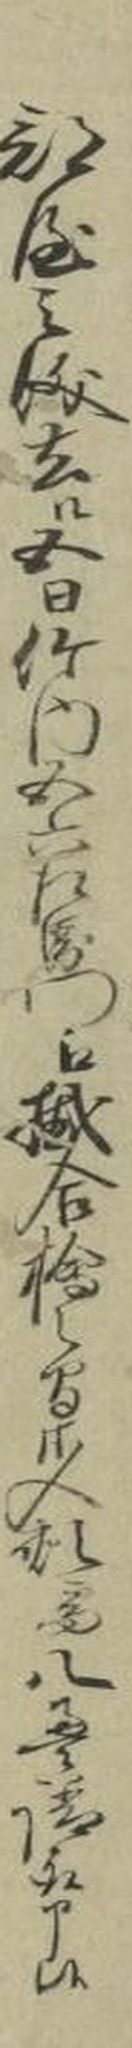一部屋之儀去る五日竹内五六左衛門え掛合桧之間御入頬にて八畳請取申候
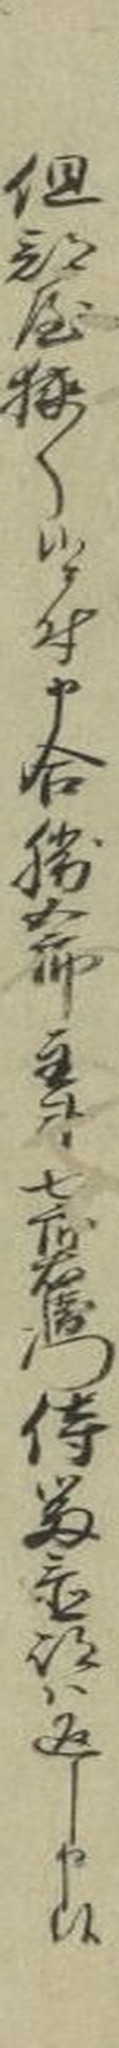但部屋狭く候に付申合勝五郎主計七郎右衛門侍番置跡は返し申候
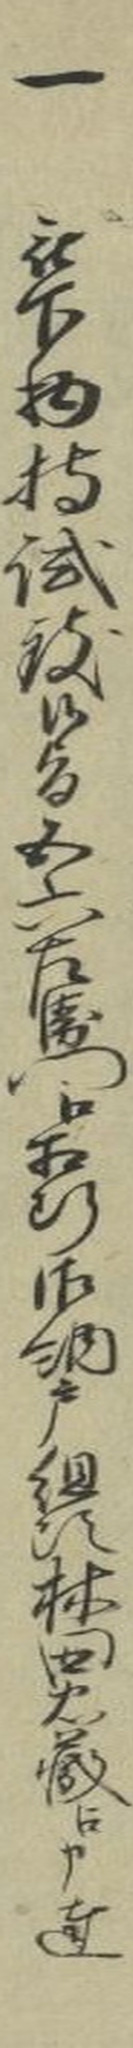一被下物持試致候旨五六左衛門え相断御納戸組頭林田忠蔵え申達
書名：天保三壬辰年琉球人参府之節勤方書留
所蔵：University of the Ryukyus Library
